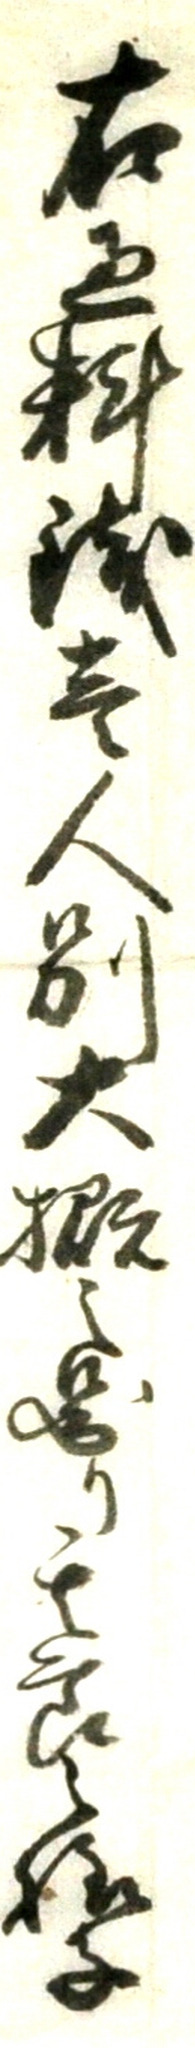右過料銭壱人別大概之図り其節之様子
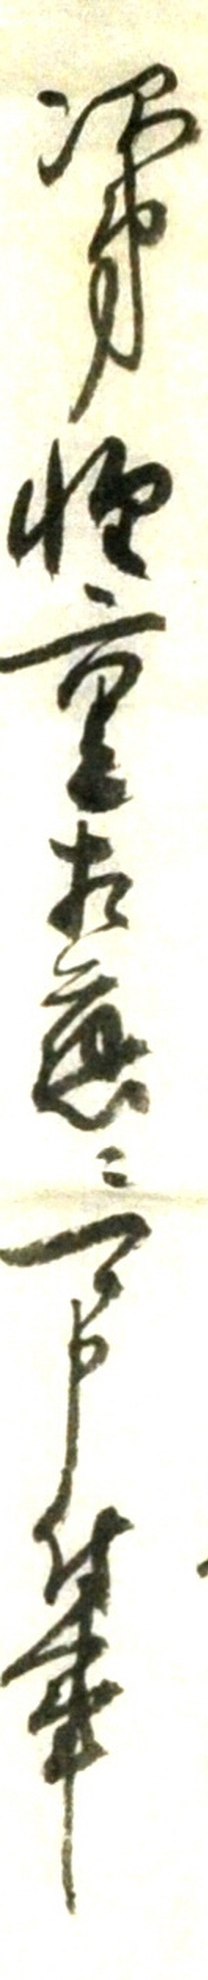次第軽重相応ニ可申付事
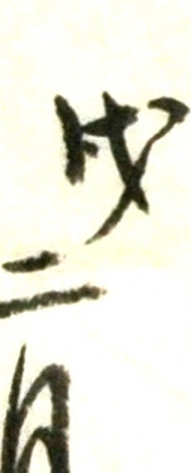戌二月
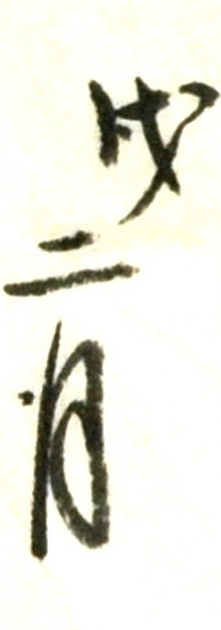戌二月
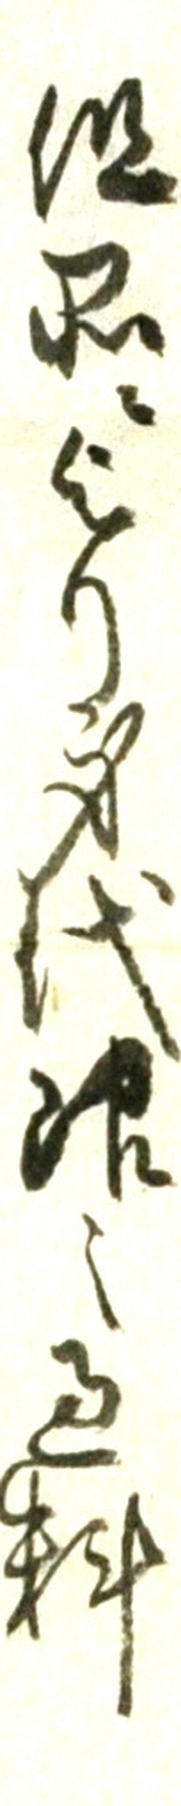但品ニより身代銀之過料
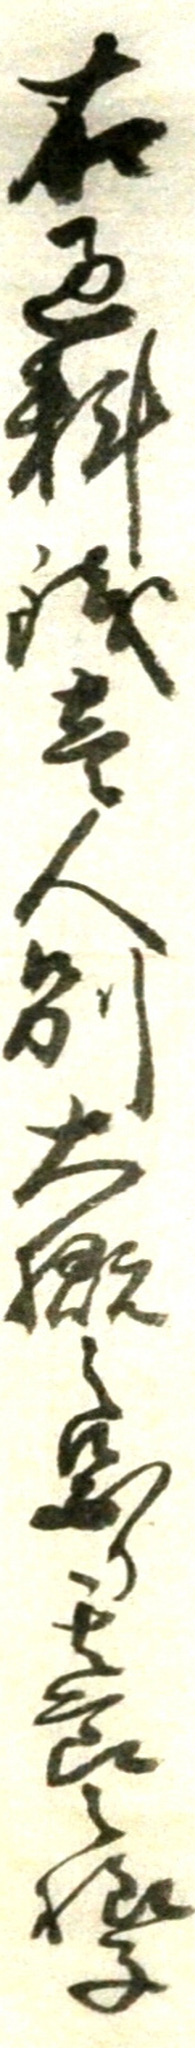右過料銭壱人別大概之図り其節之様子
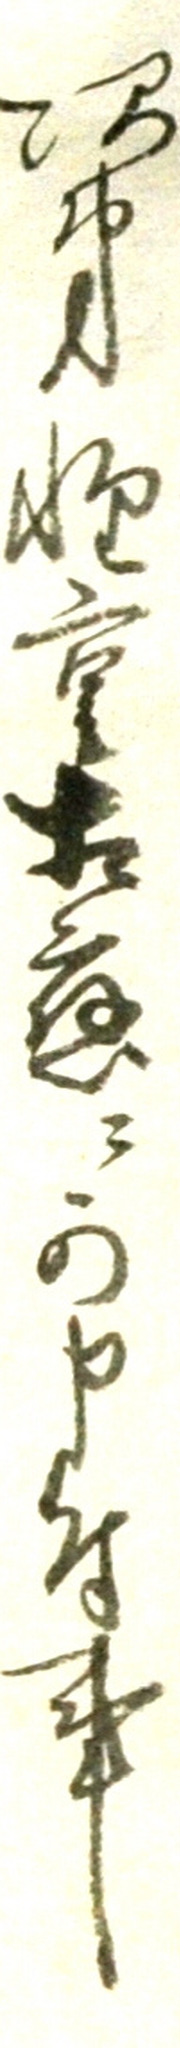次第軽重相応ニ可申付事

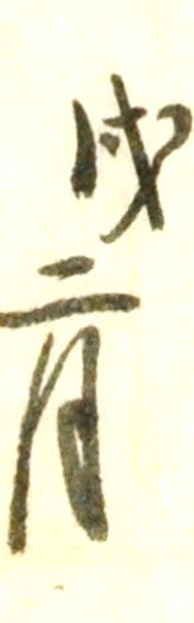戌二月
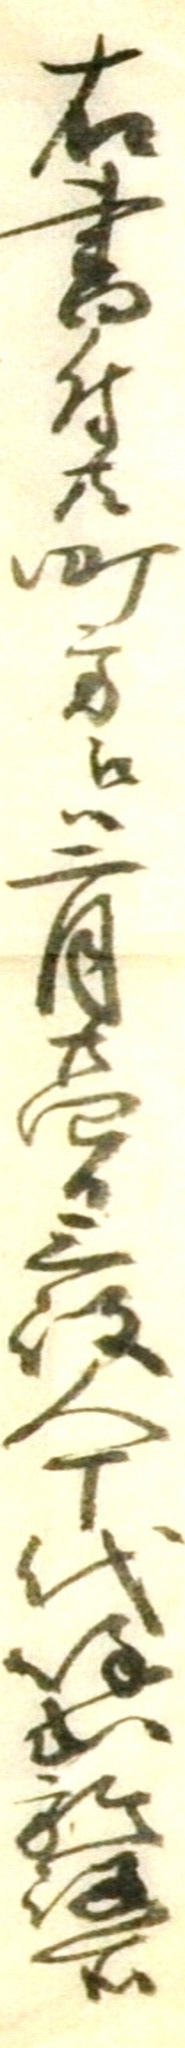右書付共町方江ハ二月廿四日三役人丁代呼出於役所
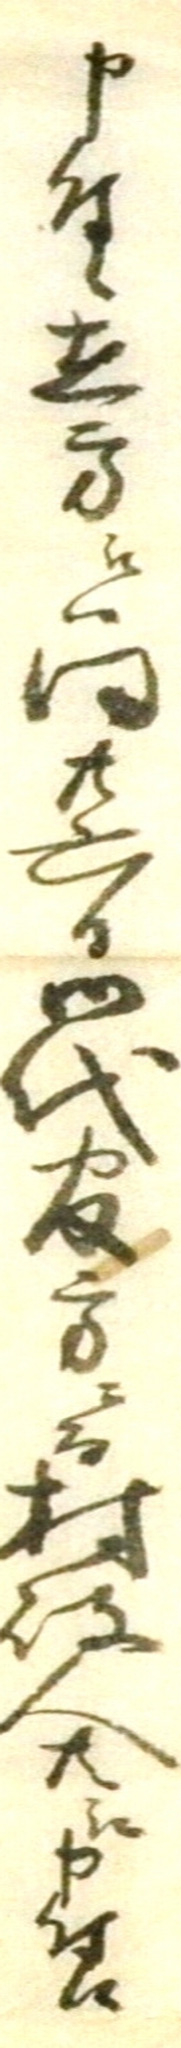申付候在方江ハ同廿六日御代官方ニ而村役人共江申付候
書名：留書
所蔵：伊那市立高遠町図書館・合同会社AMANE
